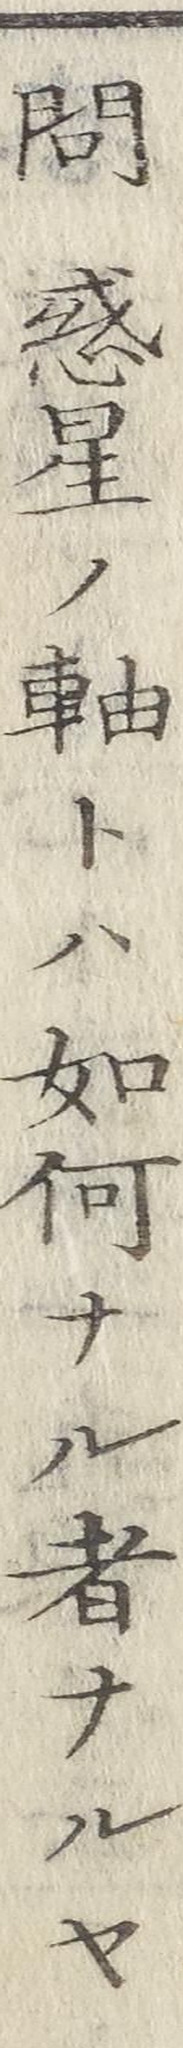問惑星ノ軸トハ如何ナル者ニヤ

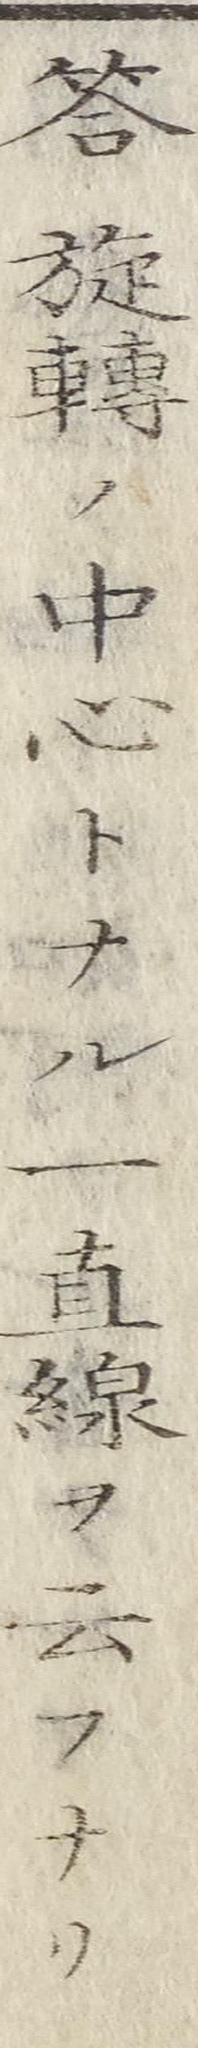答旋転ノ中心トナル一直線ヲ云フナリ
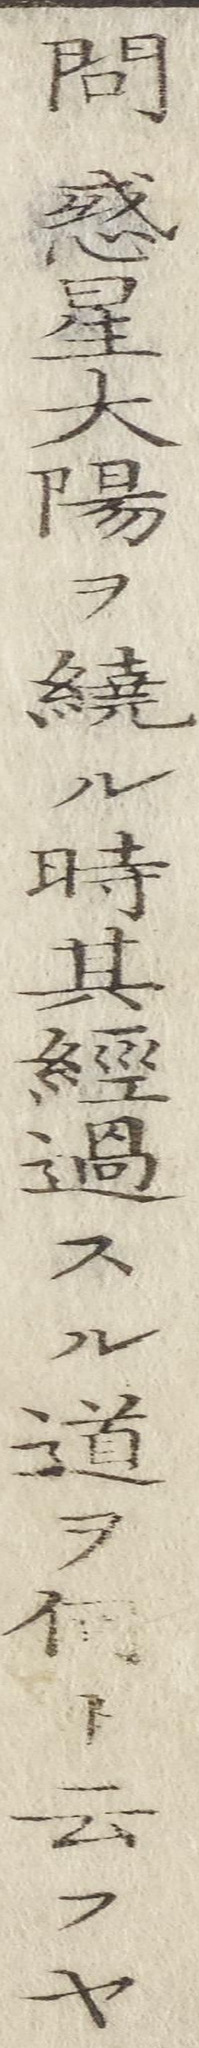問惑星大陽ヲ繞ル時其経過スル道ヲ何ト云フヤ
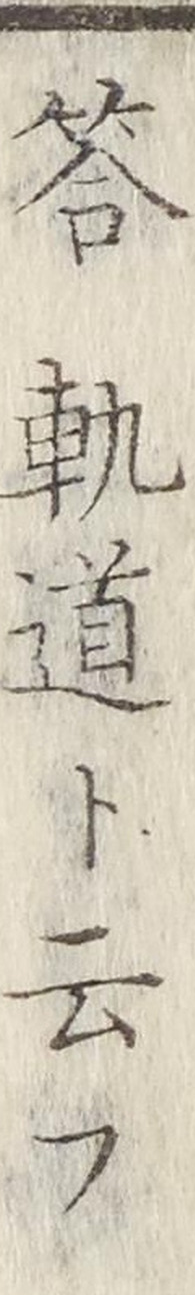答軌道ト云フ
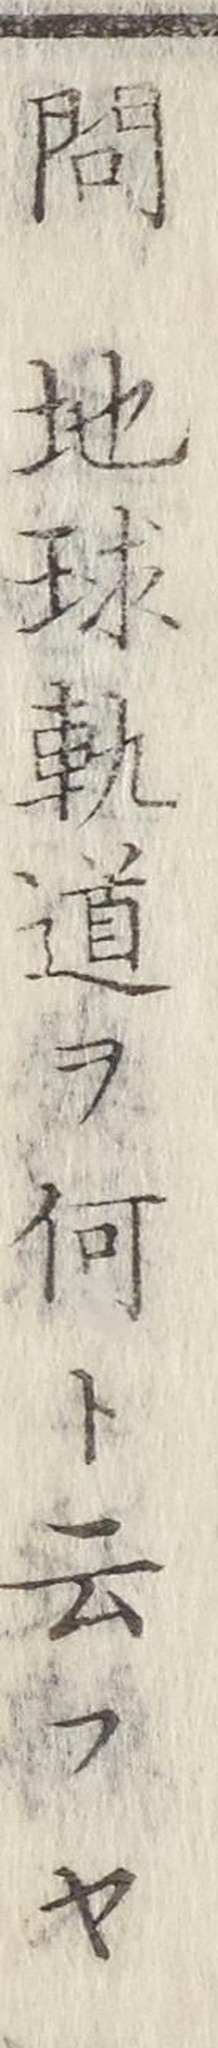問地球軌道ヲ何ト云フヤ
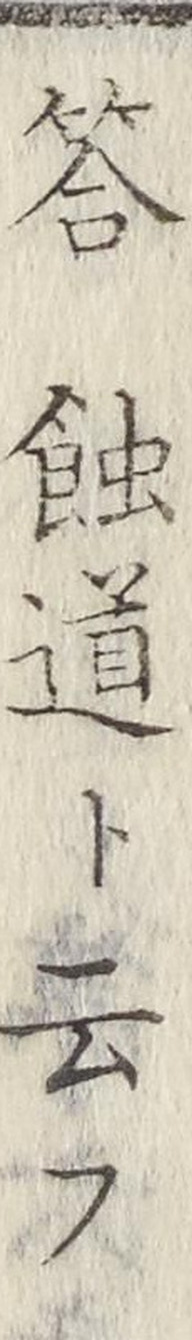答蝕道ト云フ
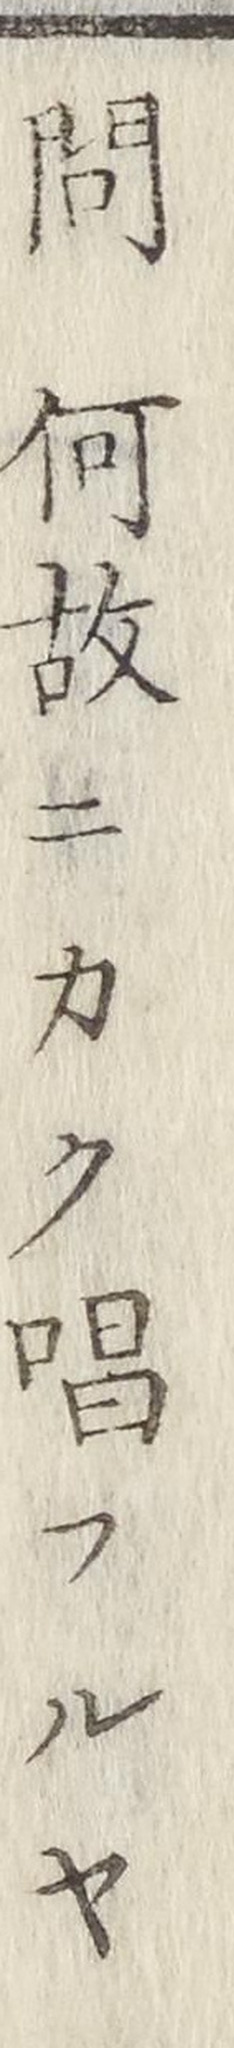問何故ニカク唱フルヤ
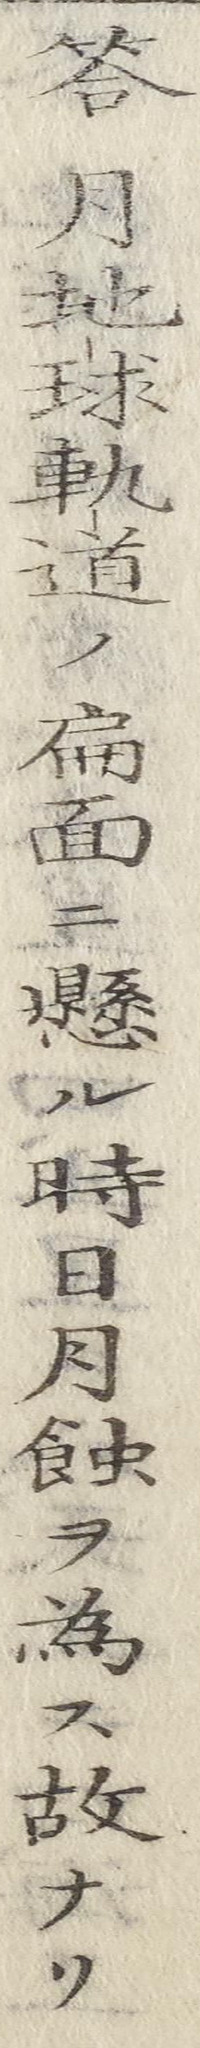答月地球軌道ノ扁面ニ懸ル時日月蝕ヲ為ス故ナリ
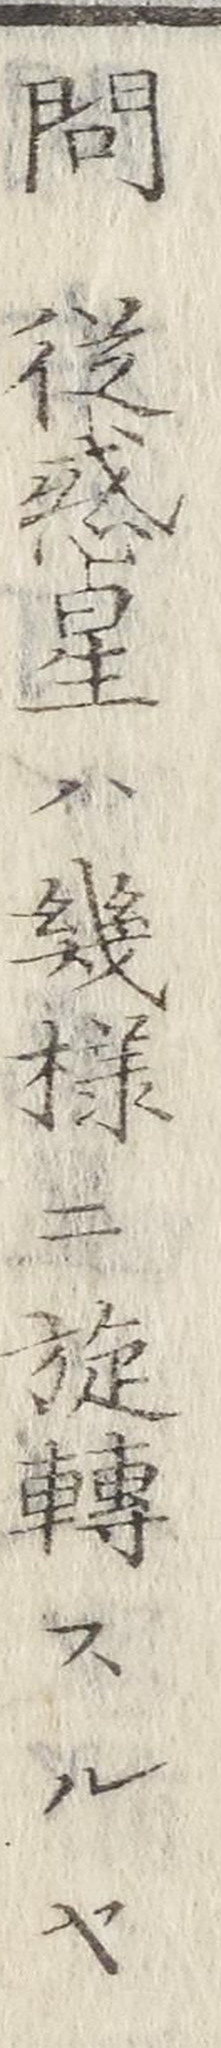問従惑星ハ幾様ニ旋転スルヤ
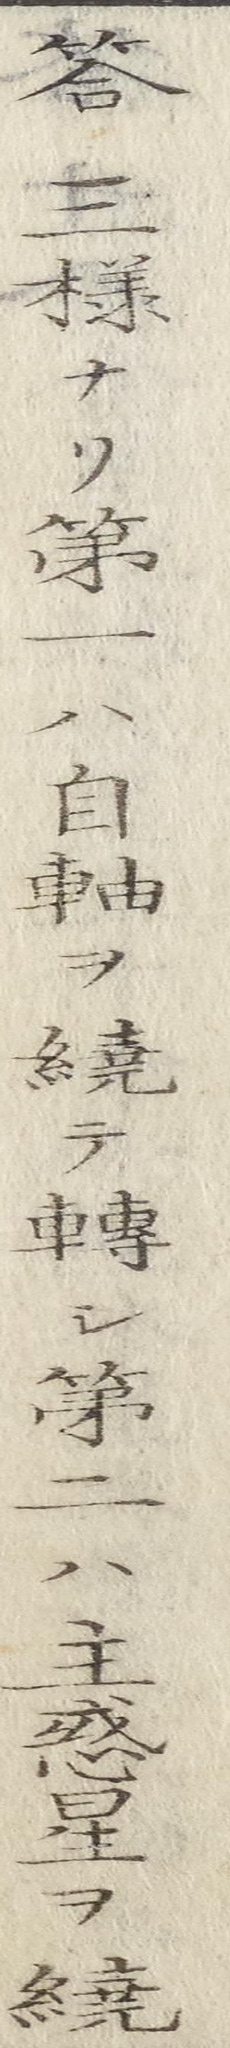答三様ナリ第一ハ自軸ヲ繞テ転シ第二ハ主惑星ヲ繞
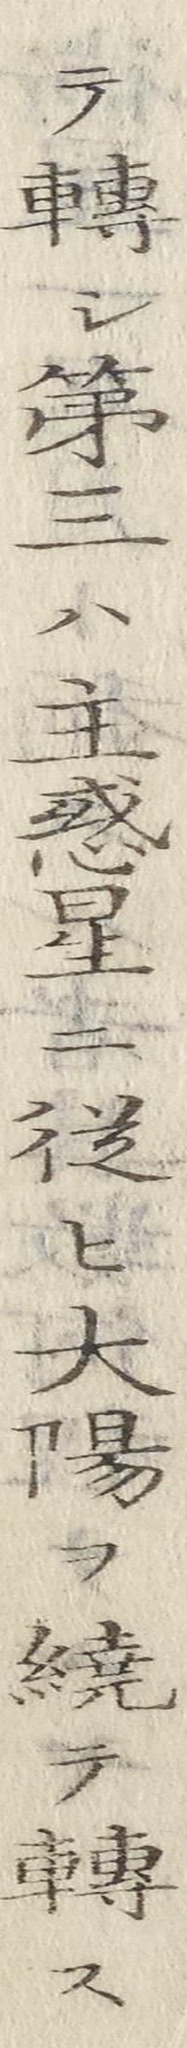テ転シ第三ハ主惑星ニ従ヒ大陽ヲ繞テ転ス
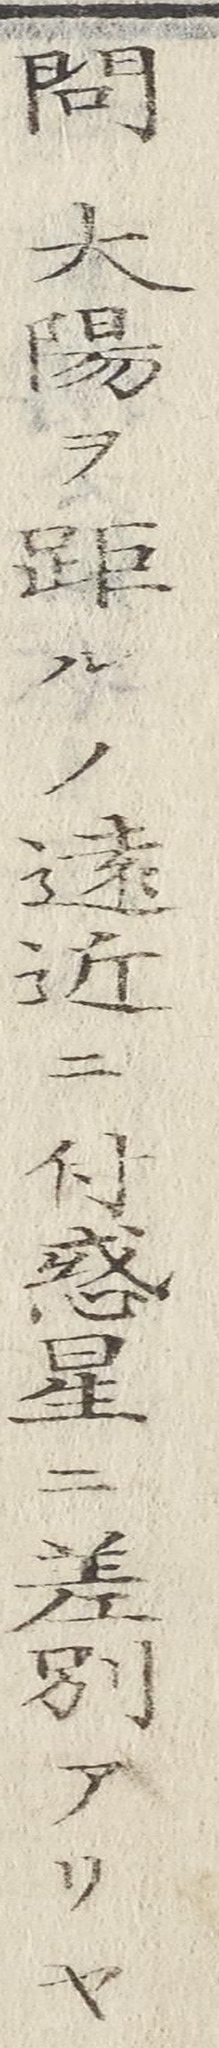問大陽ヲ距ルノ遠近ニ付惑星ニ差別アリヤ
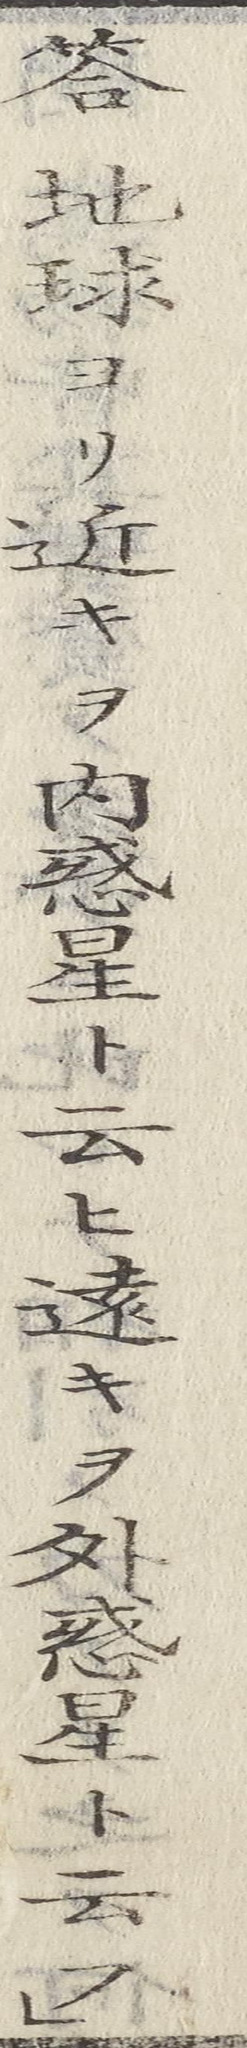答地球ヨリ近キヲ内惑星ト云ヒ遠キヲ外惑星ト云フ」
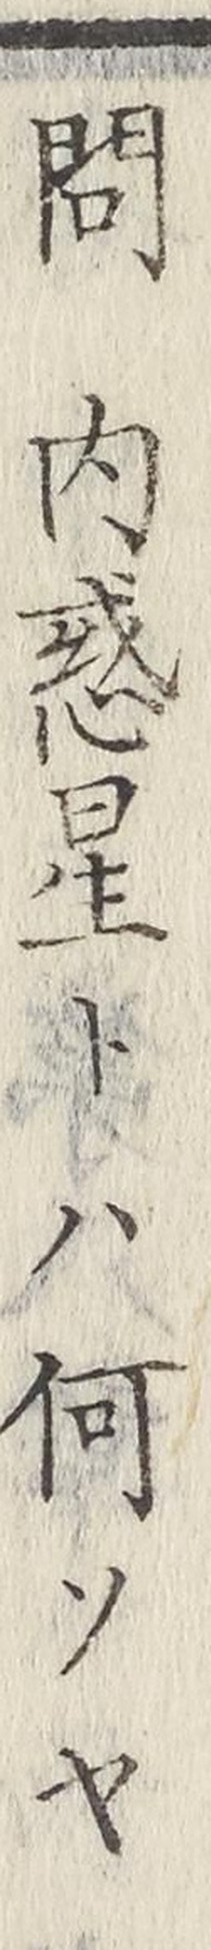問内惑星トハ何ソヤ
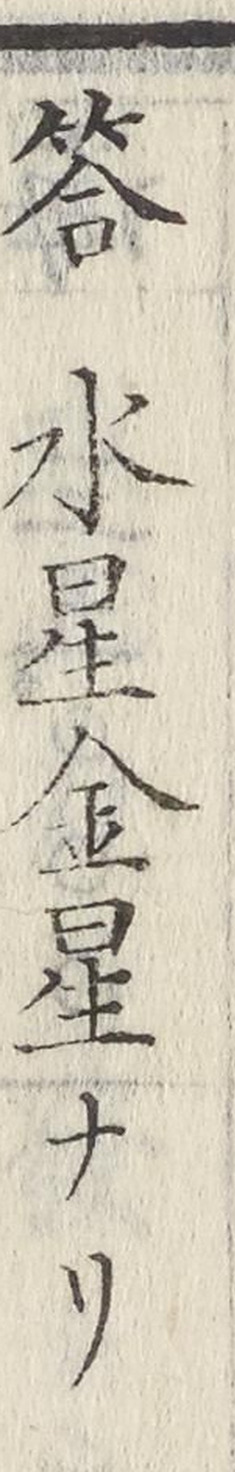答水星金星ナリ
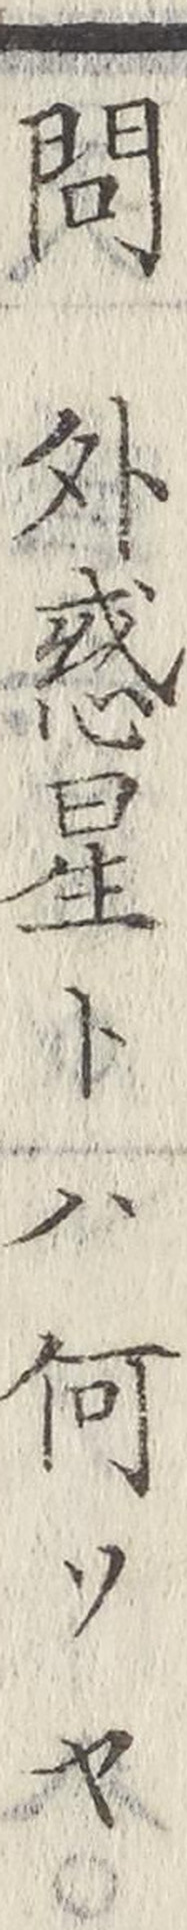問外惑星トハ何ソヤ
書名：星学圖説　上
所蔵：東京大学地震研究所図書室 Earthquake Research Institute Library, The University of Tokyo, JAPAN
